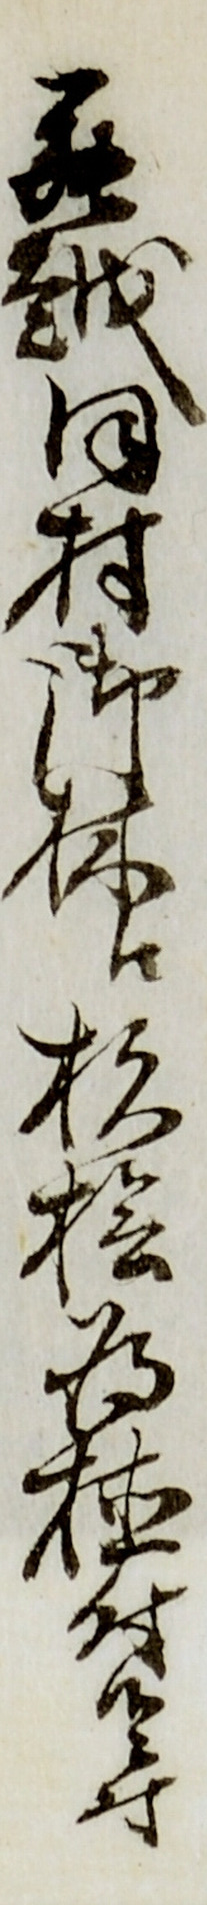罷越同村御林え杉桧為植付候に付
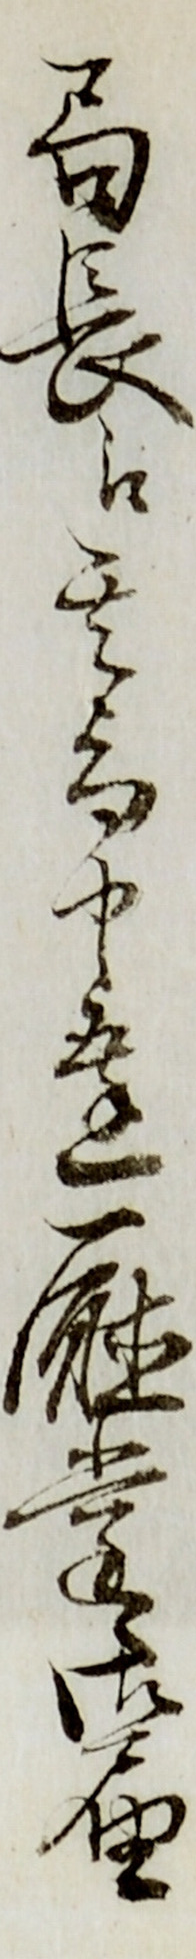局長え其旨申達庁掌へ御届
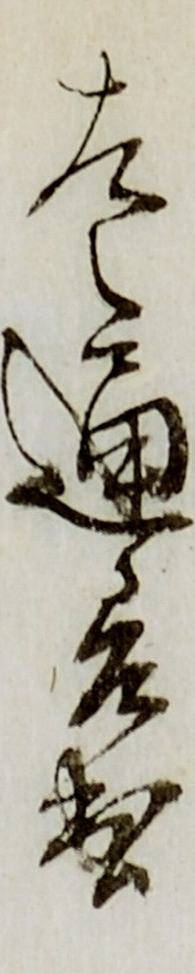左之通差出候
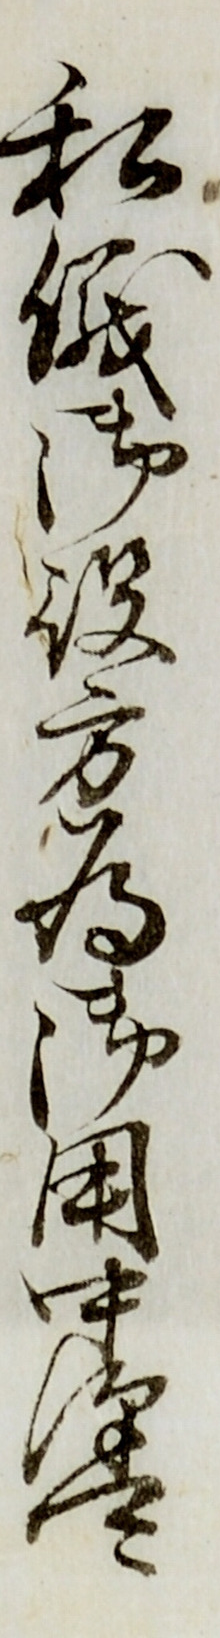私儀御役方為御用中沢郷へ
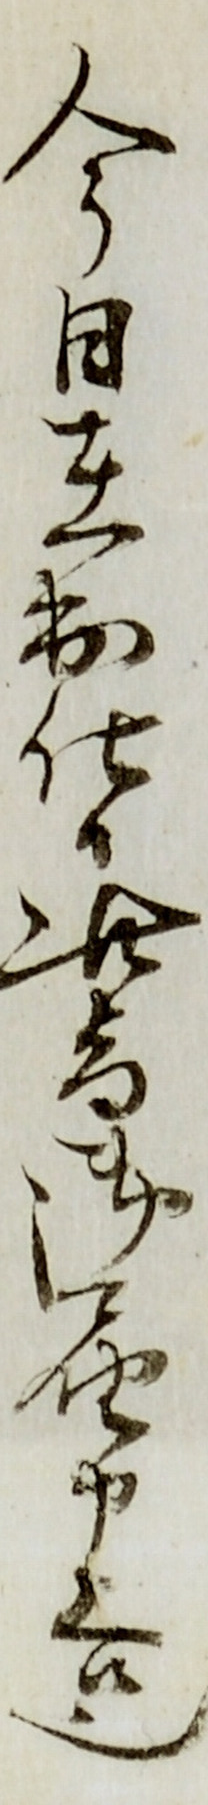今日在出仕候此旨御届申上候也
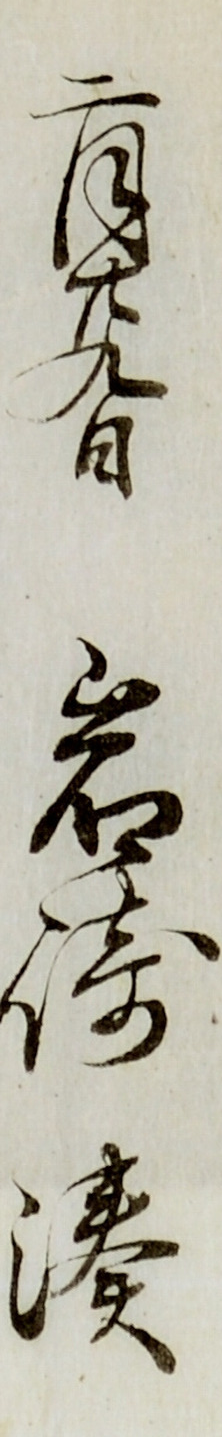二月廿九日岩崎湊
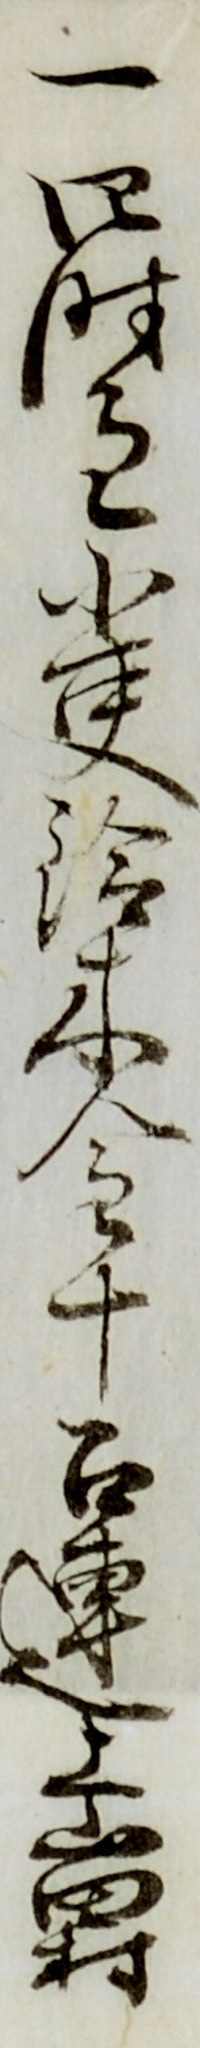一四時過小吏鈴木金十召連上山田村
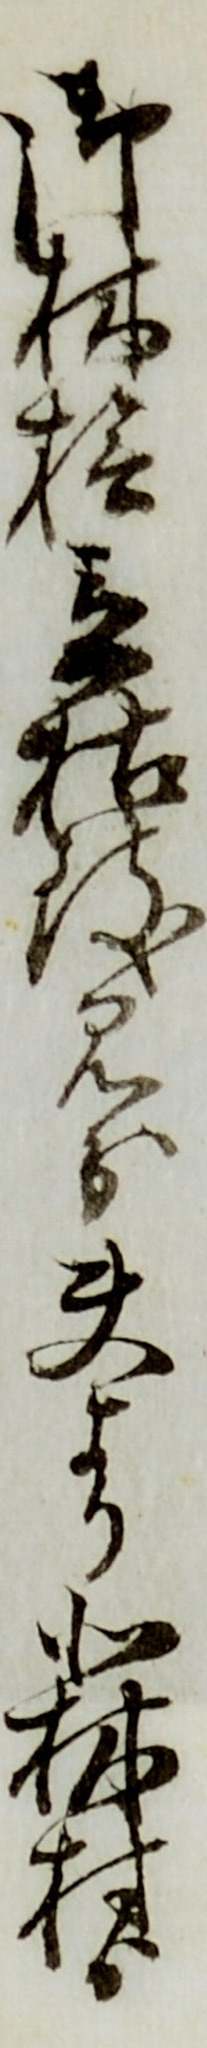御林桧立枯致見分夫より北林村ゟ
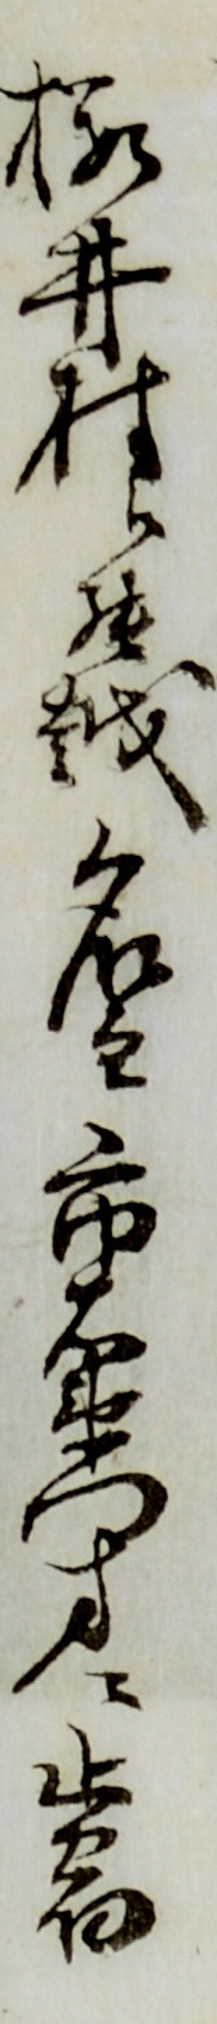桜井村え罷越名主市右衛門方に止宿

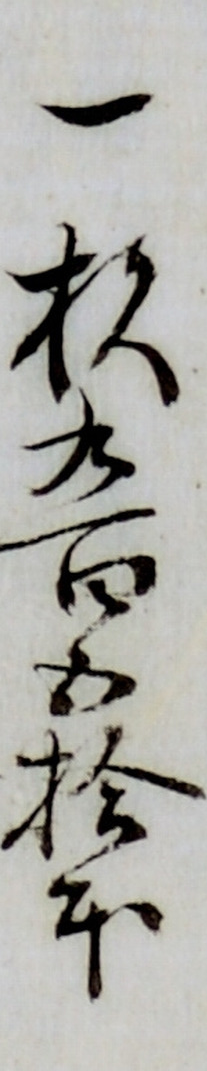一杉九百五拾本
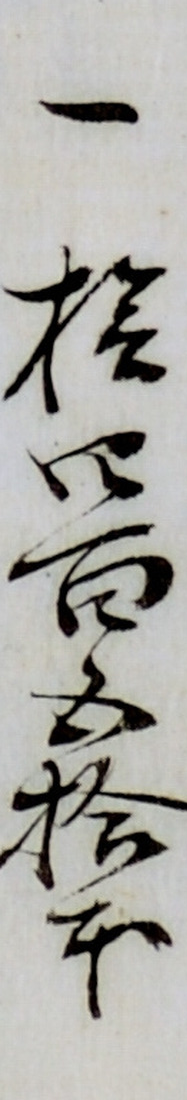一桧四百五拾本
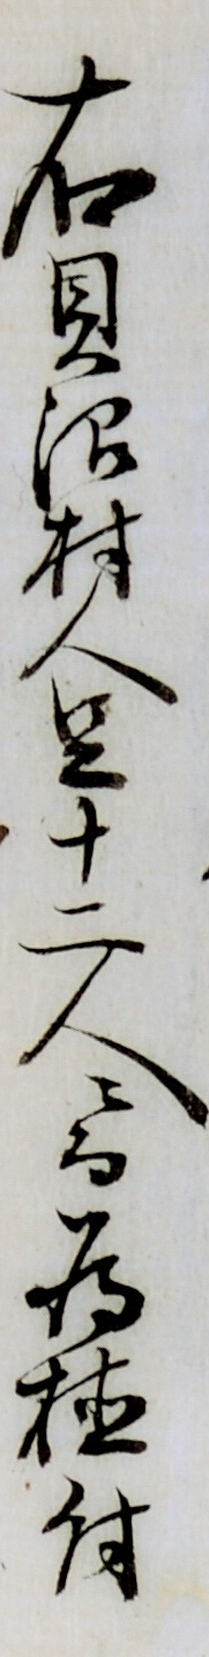右貝沼村人足十二人にて為植付

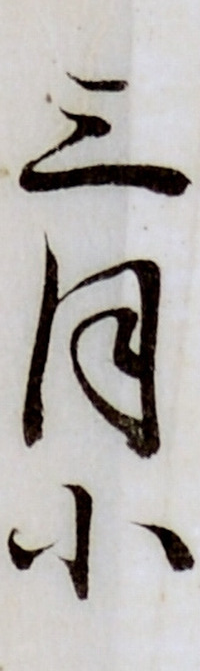三月小
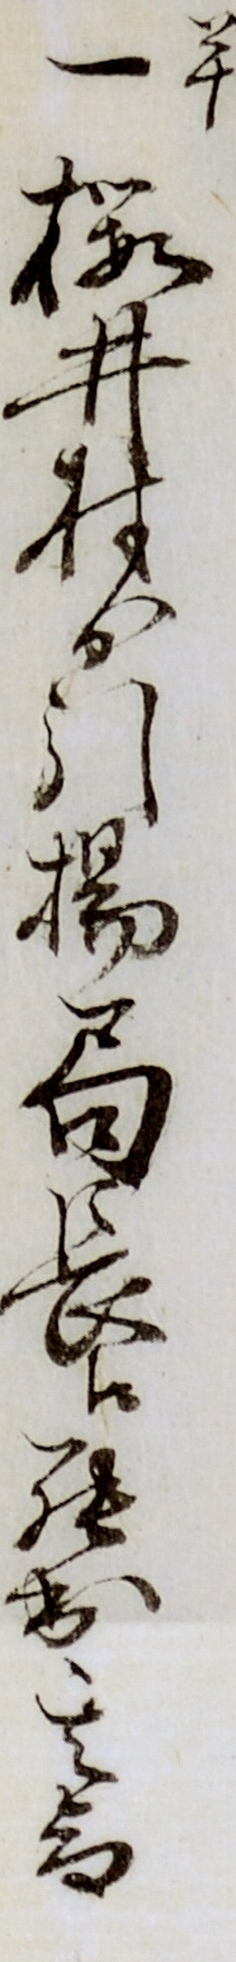一桜井村ゟ引揚局長え罷出其旨
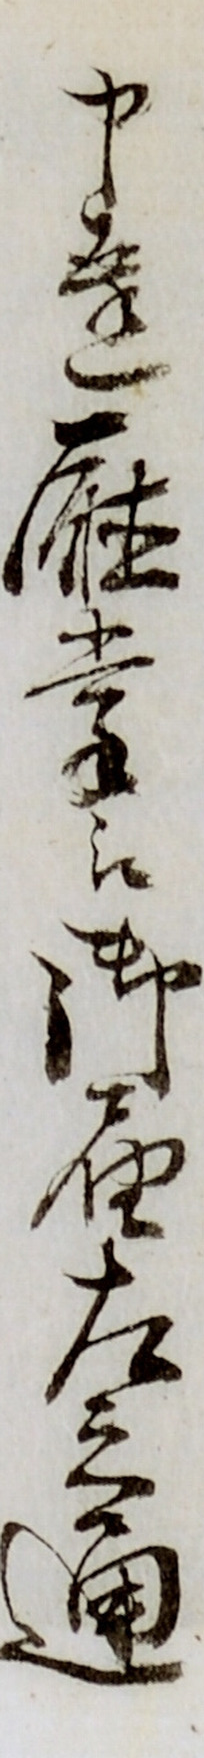申達庁掌え御届左之通
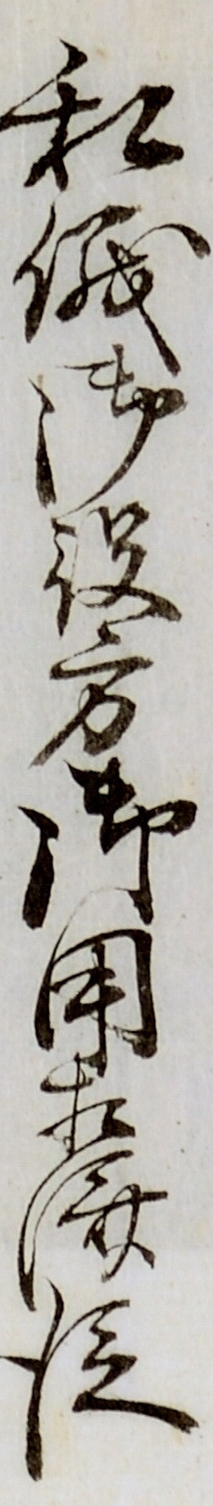私儀御役方御用相済従
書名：山林方諸事御用留
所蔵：伊那市立高遠町図書館・合同会社AMANE
